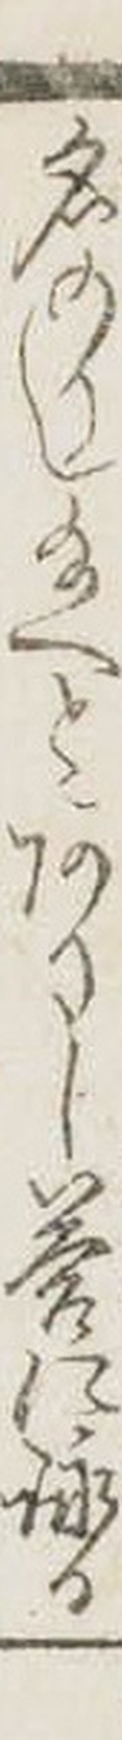名のりし給へとありし答に詠る
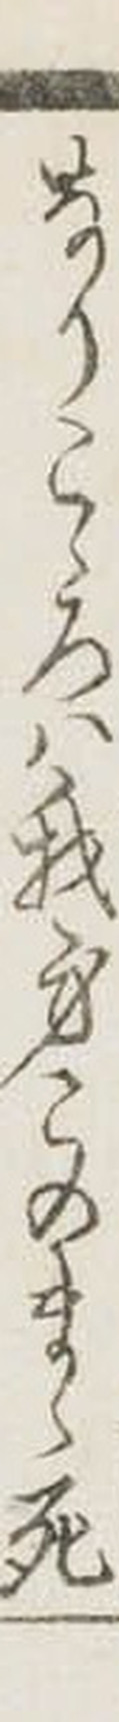なりこゝろは我身このまゝ死
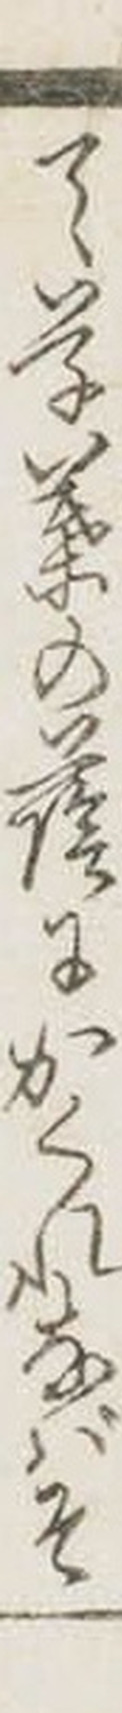て草葉の蔭にかくれなばそ
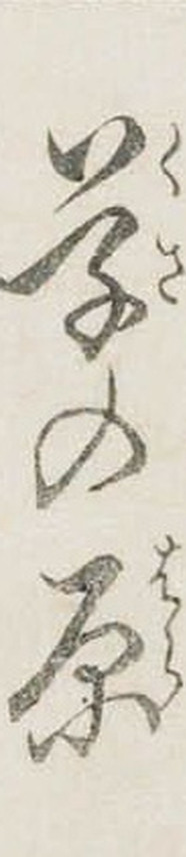草の原
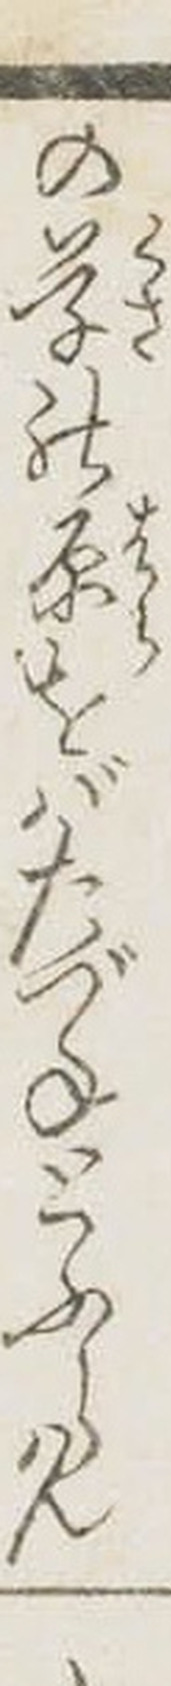の草の原をばたづねとふらはん
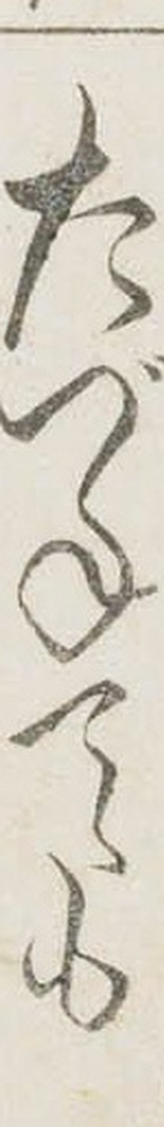たづねても
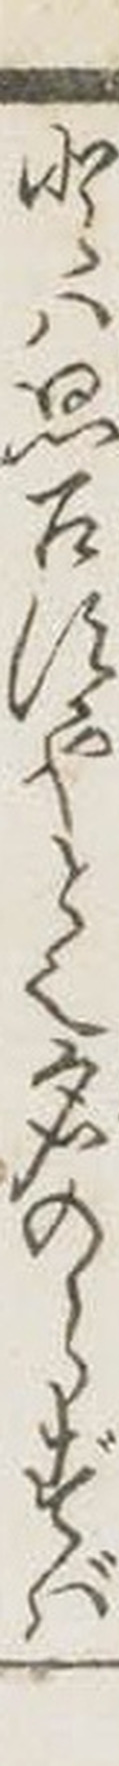とは思召ずやと也名のらずば
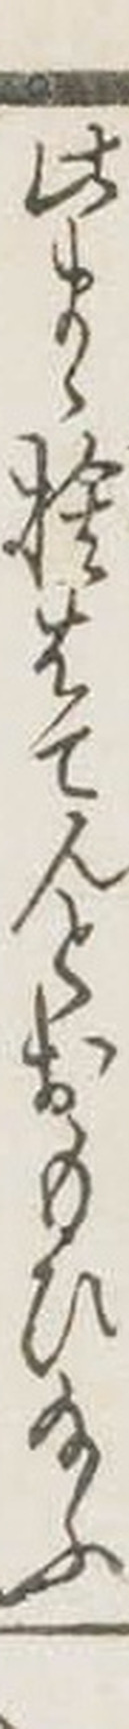此まゝ捨はてんとおもひ給ふ
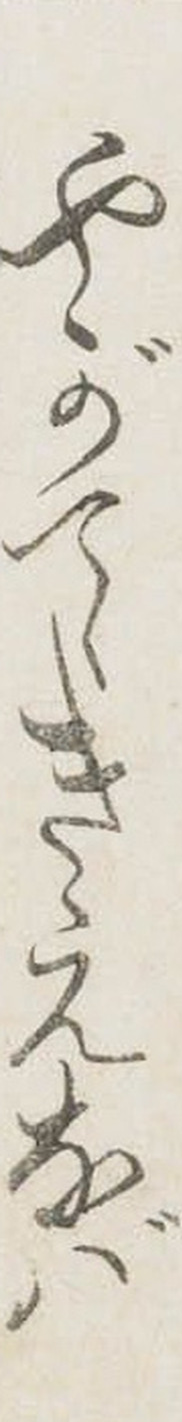やがてきえなば
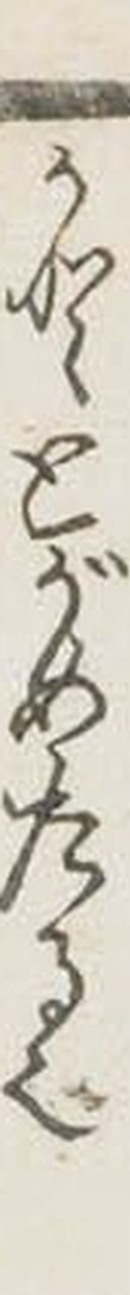かととがめたる也
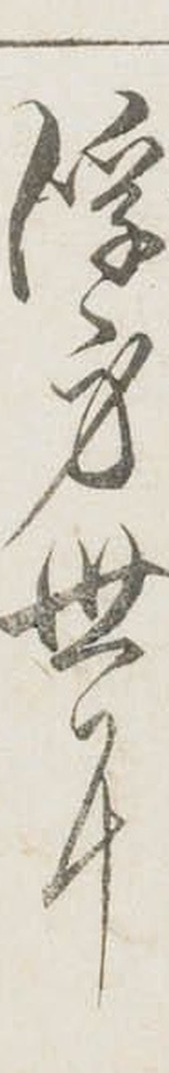浮身世に
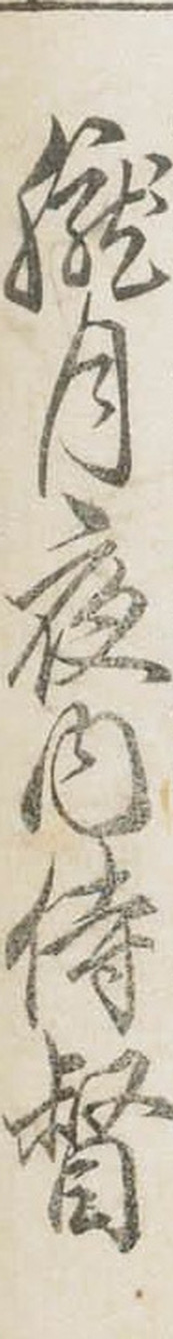朧月夜内侍督
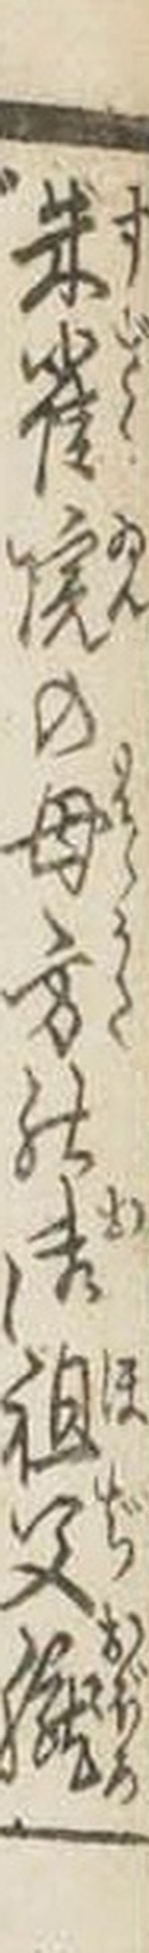朱雀院の母方の御祖父朧
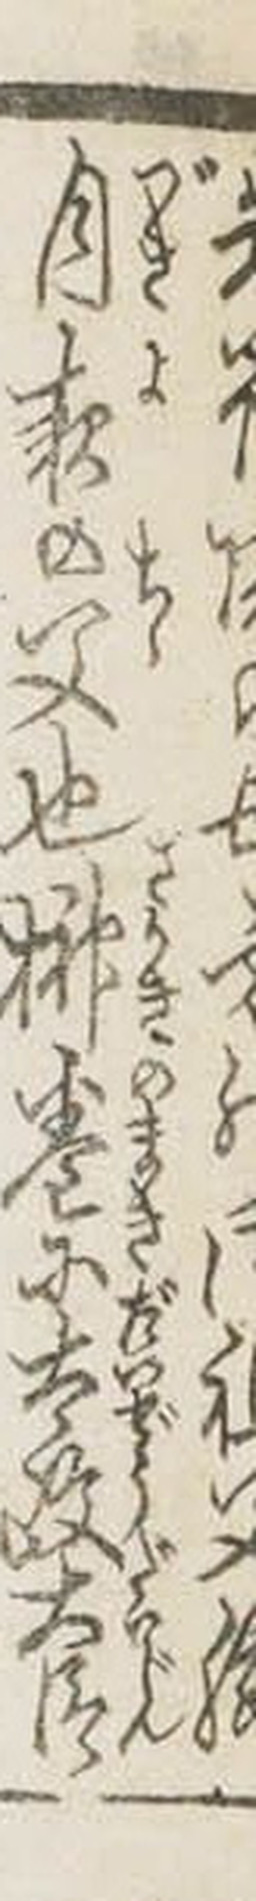月夜の父也榊巻に太政大臣
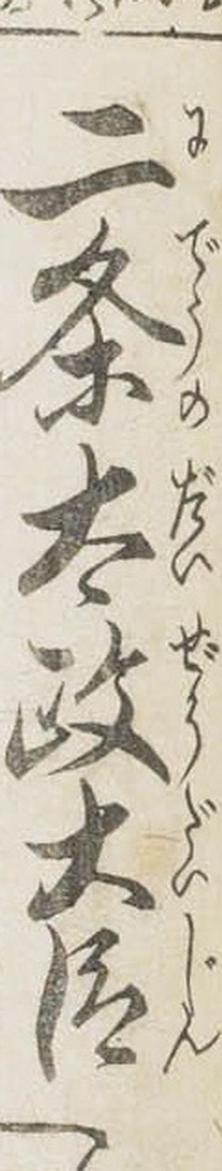二条太政大臣
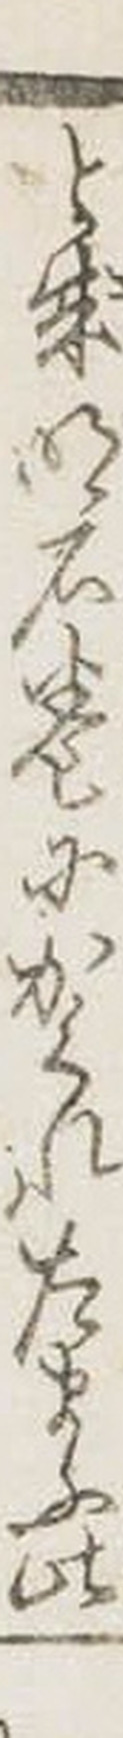と成明石巻にかくれたまふ此
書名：源氏百人一首
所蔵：東京学芸大学教育コンテンツアーカイブ
